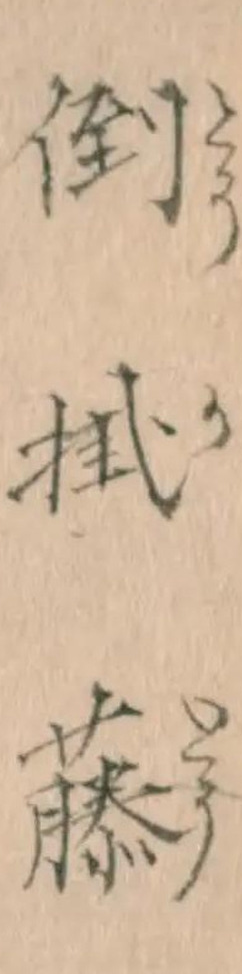倒掛藤
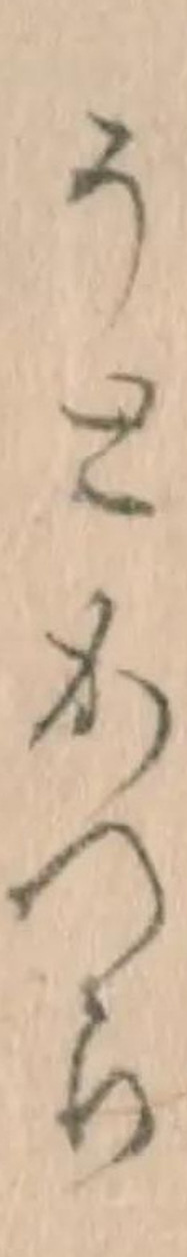うとかつら
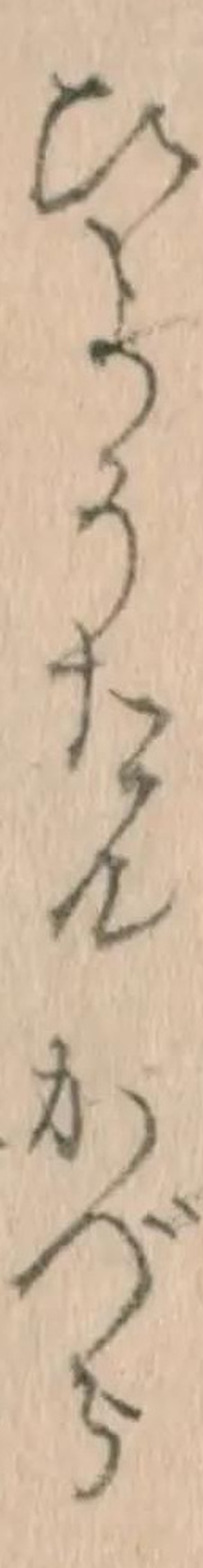ひようたんかづら
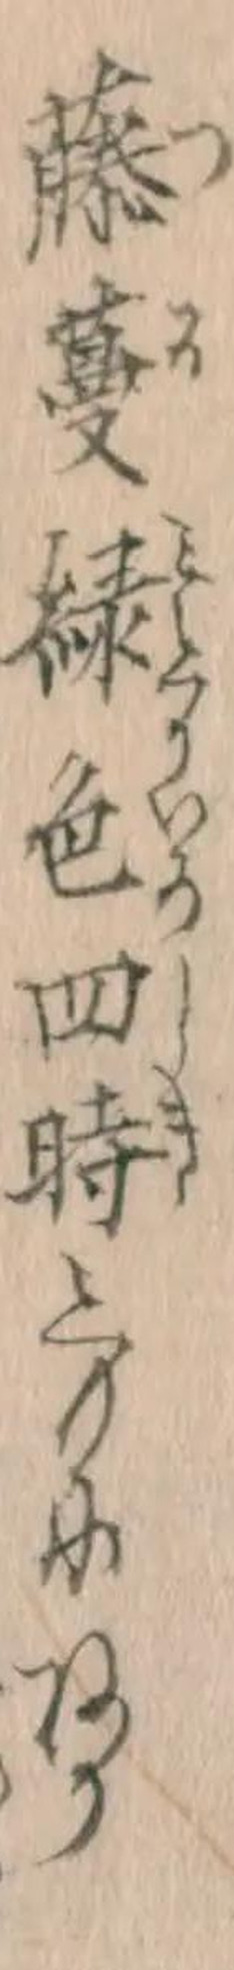藤蔓緑色四時ともにあり
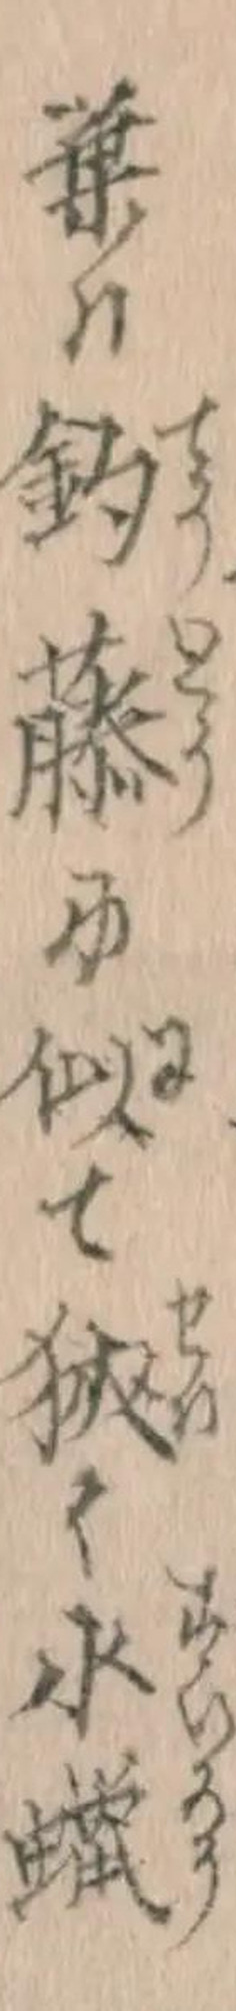葉は釣藤に似て狭く水蝋
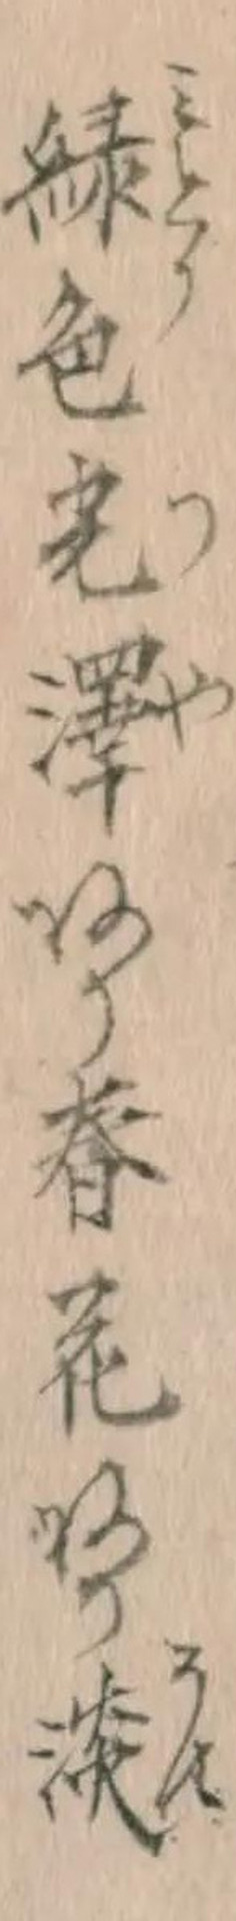緑色光沢あり春花あり淡
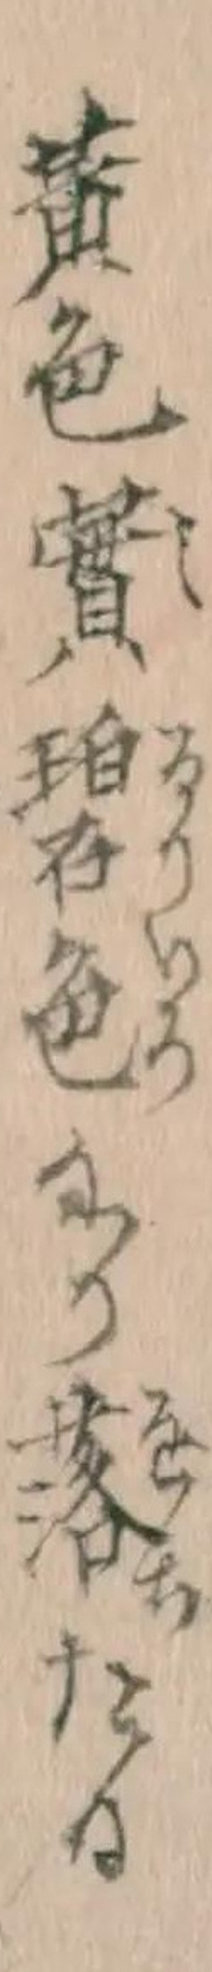黄色実碧色なり落たる
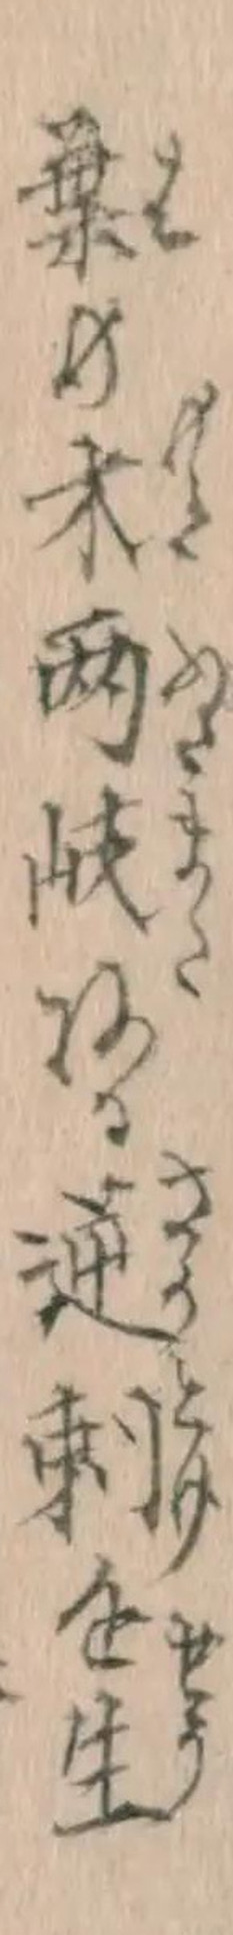葉の木両岐ある逆剌を生
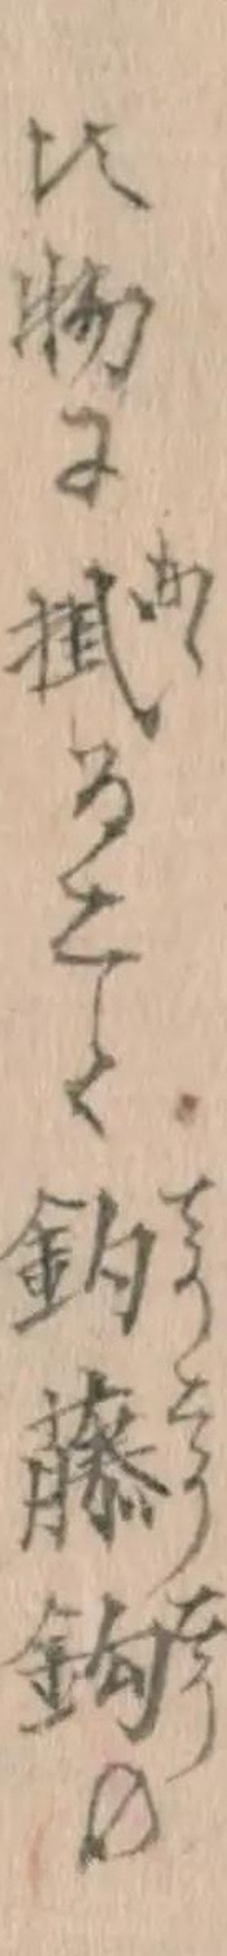す物に掛ること釣藤鉤の
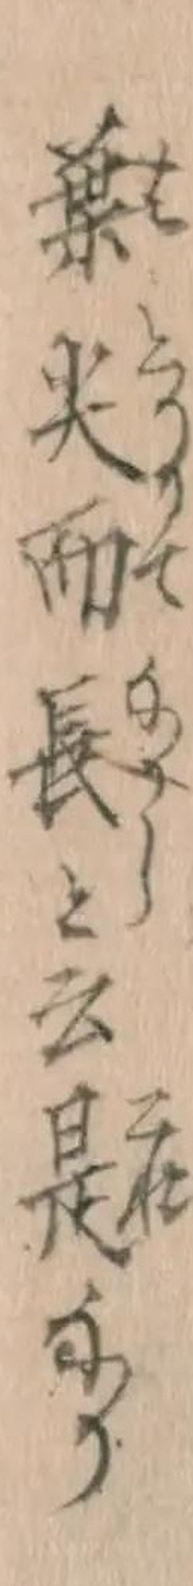葉尖而長と云是なり
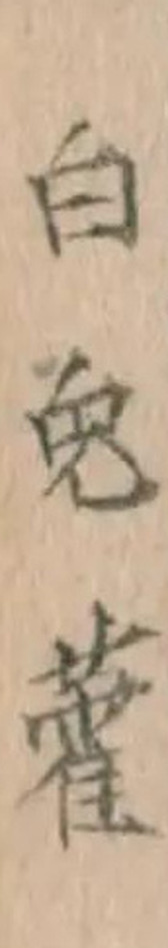白兎藿

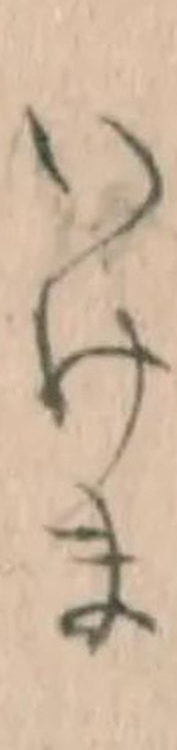いけま

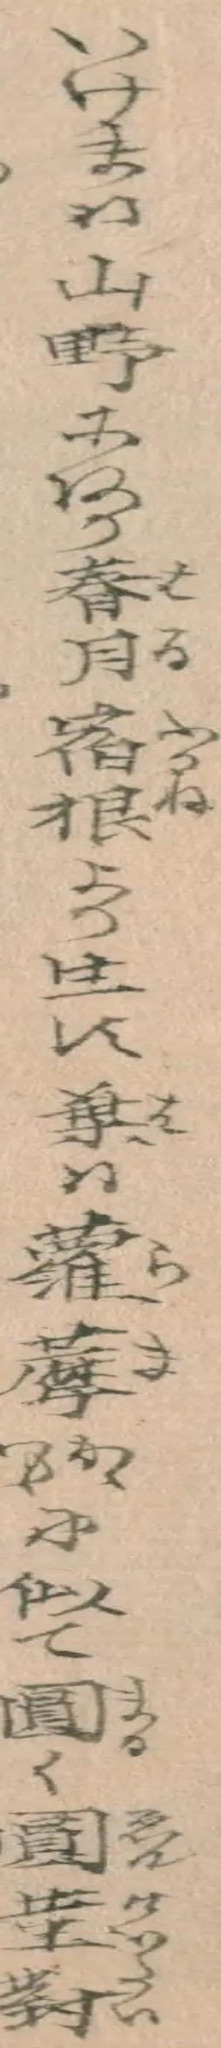いけまは山野にあり春月宿根より生す葉は蘿藦かゝいもに似て円く円茎対
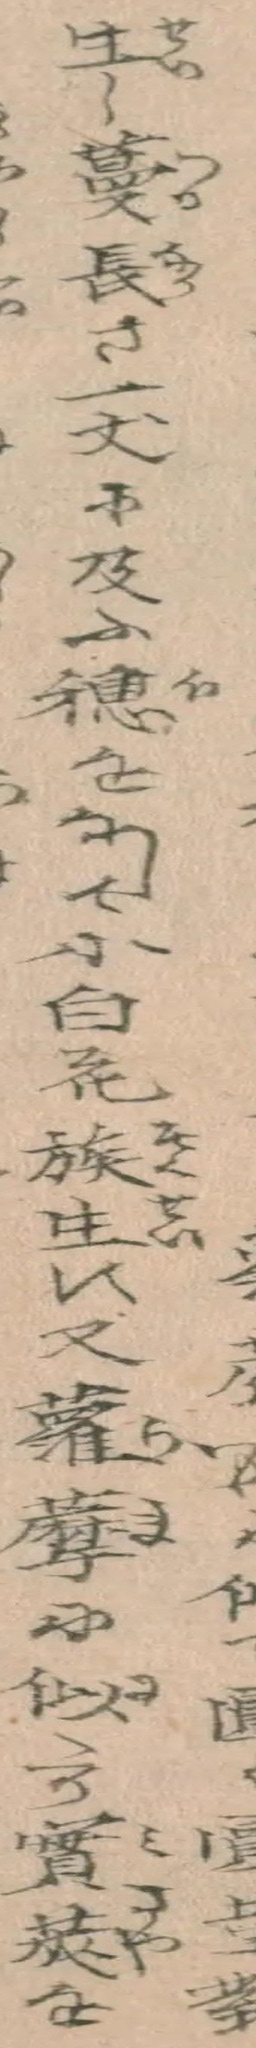生し蔓長さ一丈に及ふ穂をなして小白花族生す又蘿藦に似たり実莢を
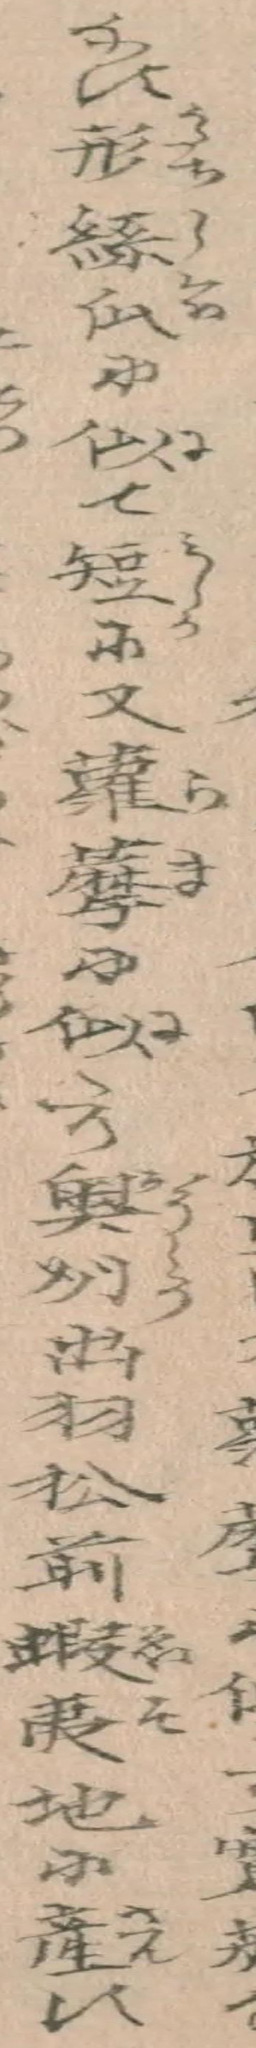なす形糸瓜に似て短に又蘿藦に似たり奥州出羽松前蝦夷地に産す
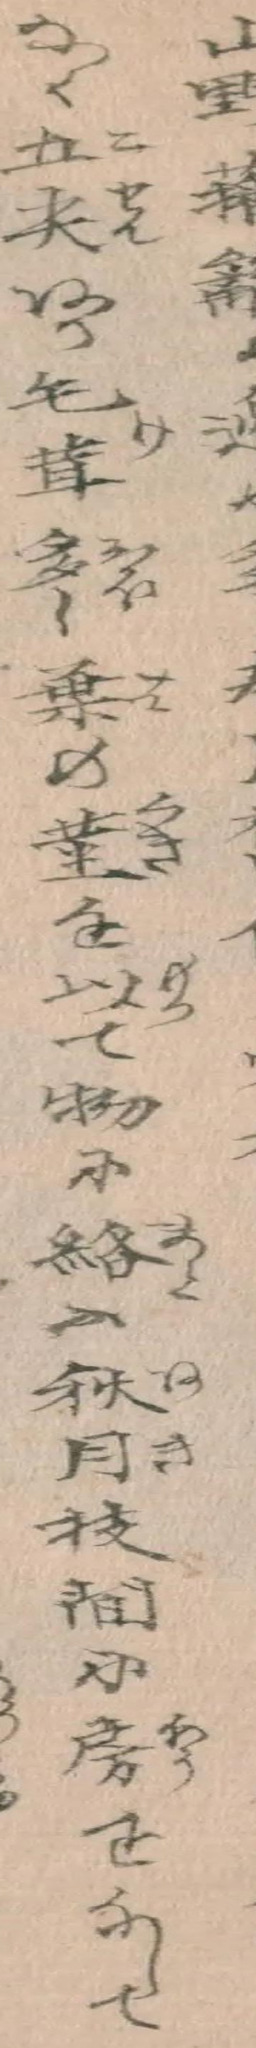なく五尖あり毛茸多し葉の茎を以て物に絡ふ秋月枝間に房をなして
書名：本草図譜. 巻28-30
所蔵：国立国会図書館 National Diet Library, JAPAN
